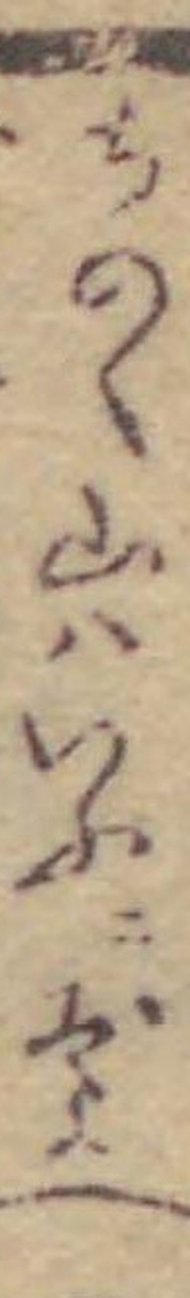ちのく山はいふにはおよ
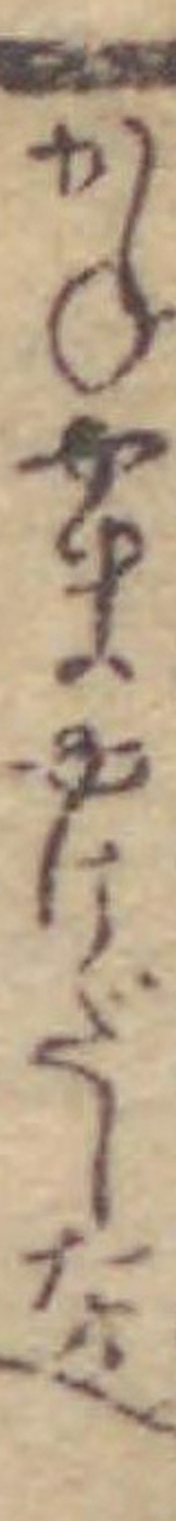かねやまやけだしたか
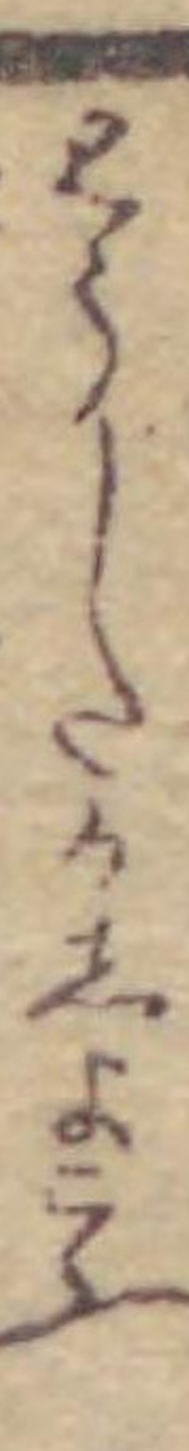とうしたかしよこく
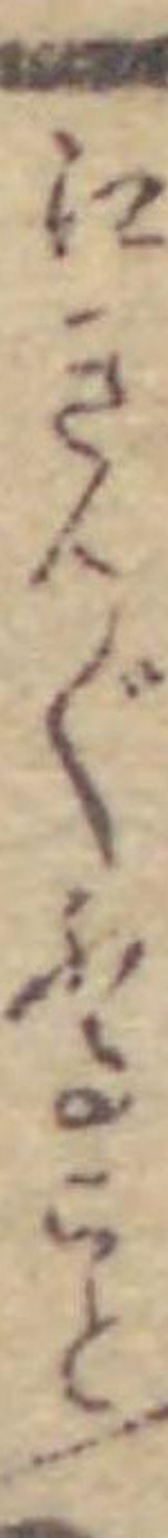えきん〴〵ふること
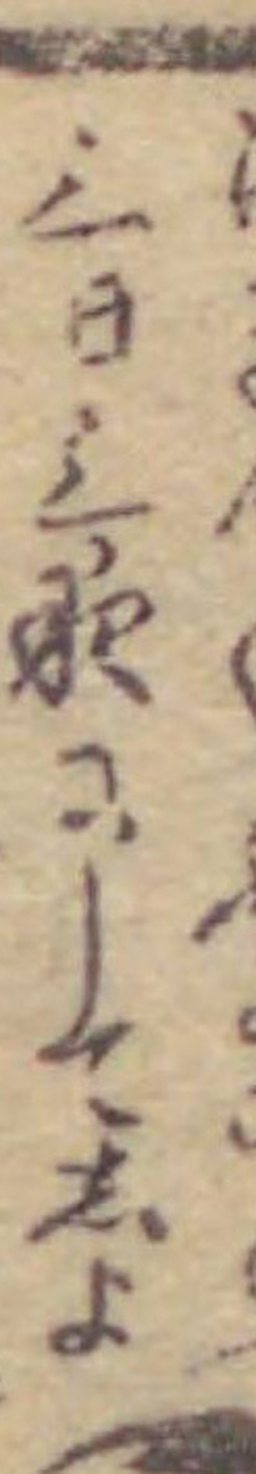三日三夜にしてしよ
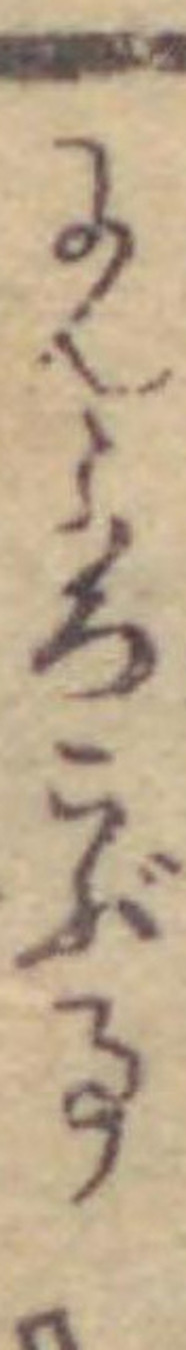にんよろこぶ事
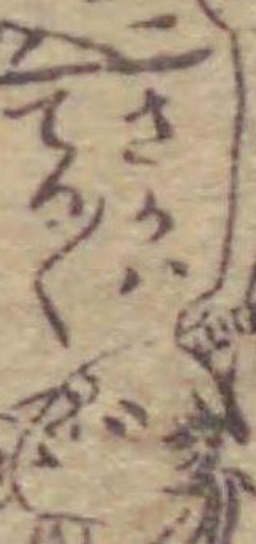てる〳〵
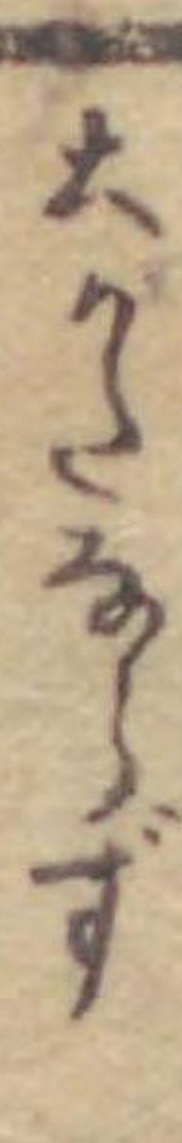大かたならず
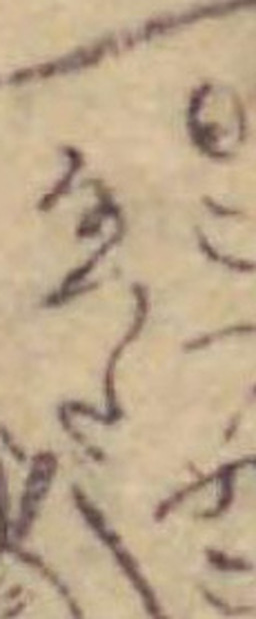なつた
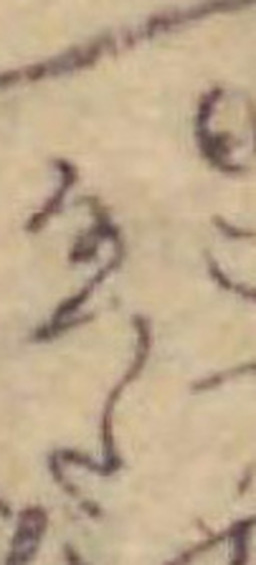なつた

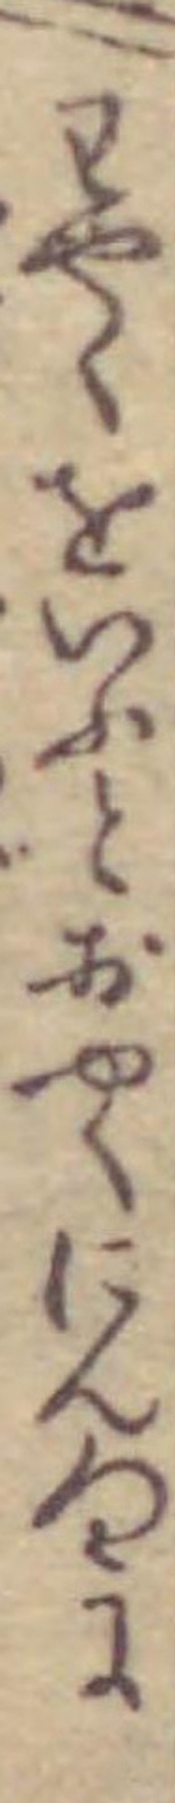わやくをいふとおやくにんさまに
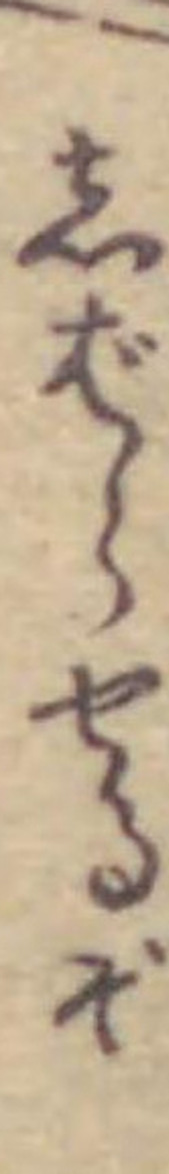しばらせるぞ
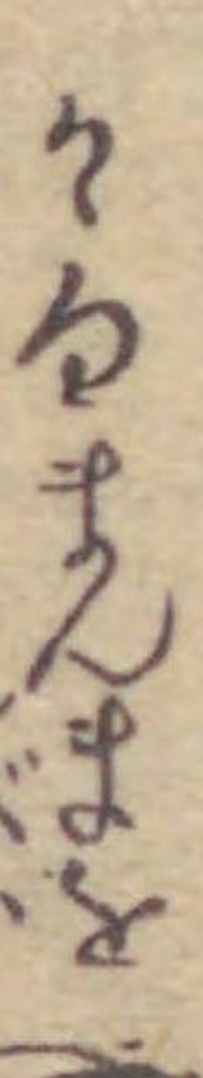かゝさままんまを
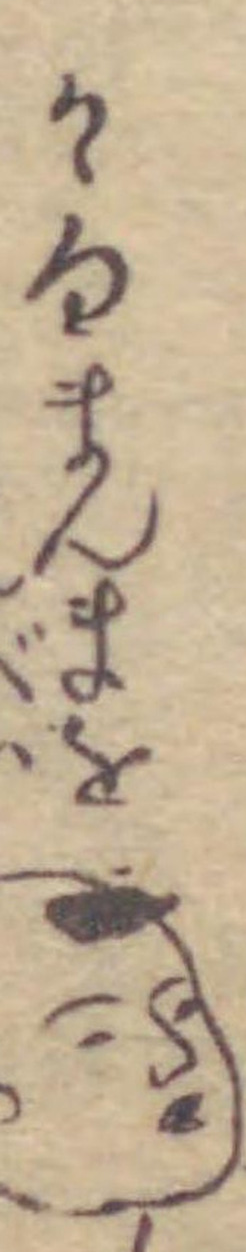かゝさままんまを
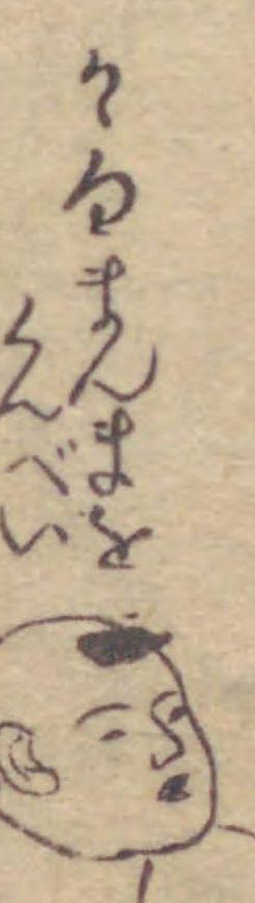かゝさままんまを
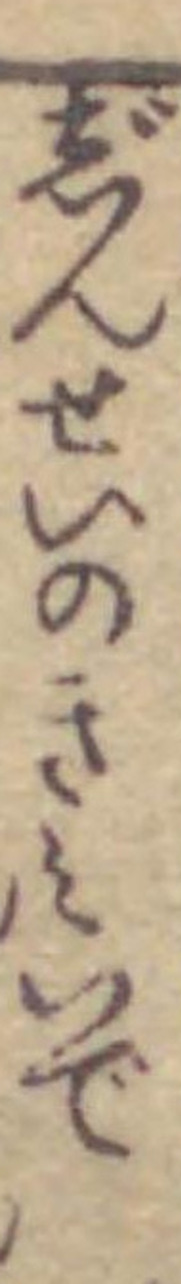じんせいのきみいで
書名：天下一面鏡梅鉢 : 3巻
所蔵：国立国会図書館 National Diet Library, JAPAN
